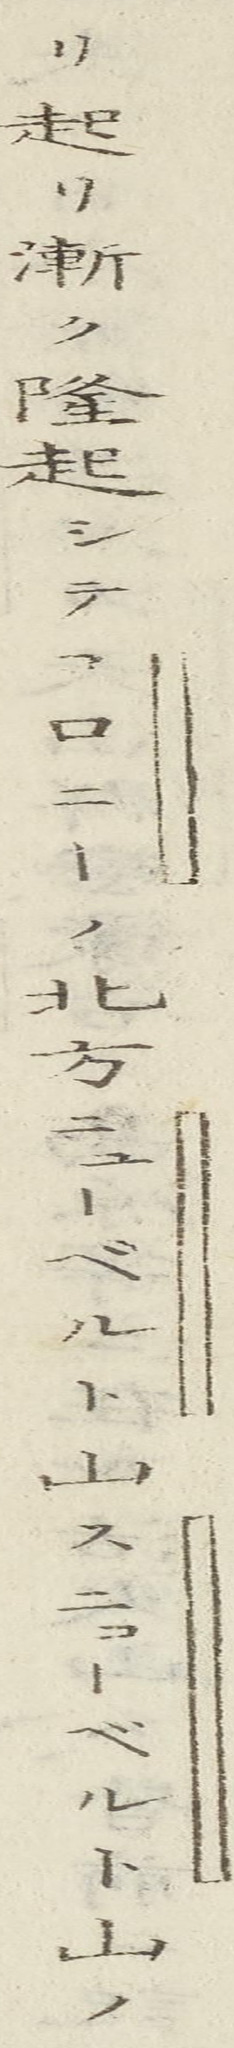リ起リ漸ク隆起シテコロニーノ北方ニューベルト山スニューベルト山ノ
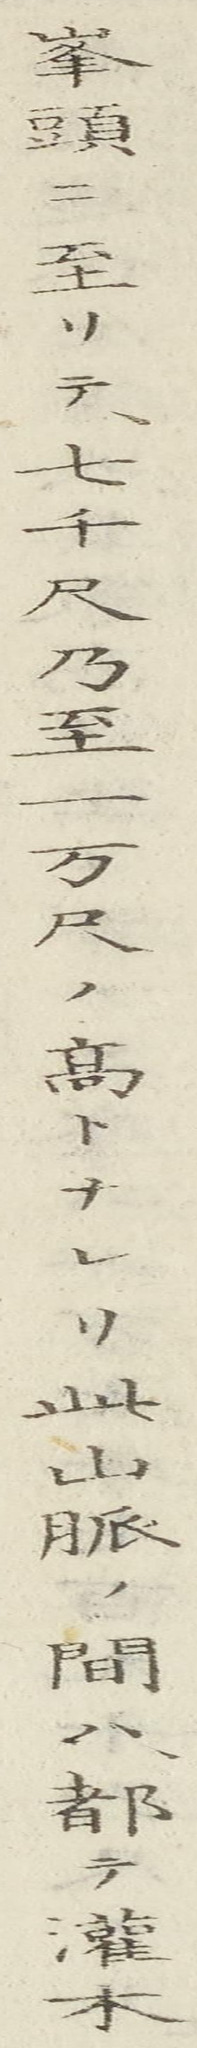峯頭ニ至リテ、七千尺乃至一万尺ノ高トナレリ此山脈ノ間ハ、都テ灌木
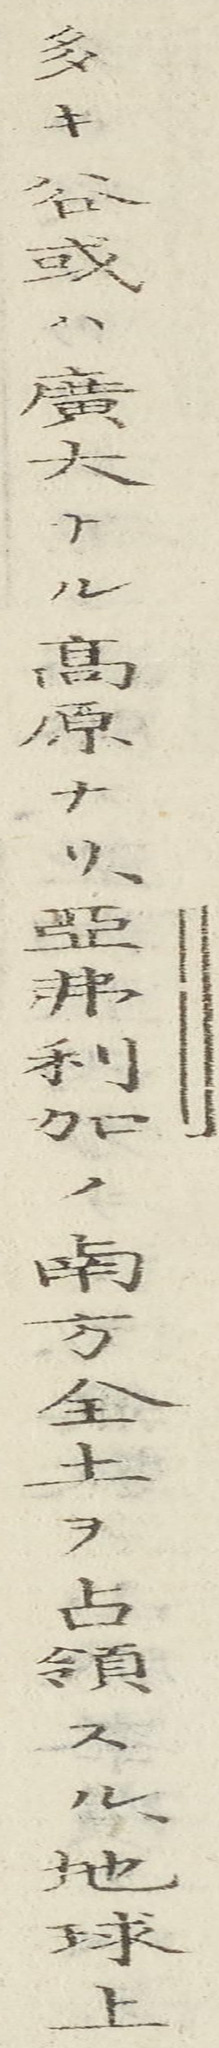多キ谷或ハ広大ナル高原ナリ、阿弗利加ノ南方全土ヲ占領スル、地球上
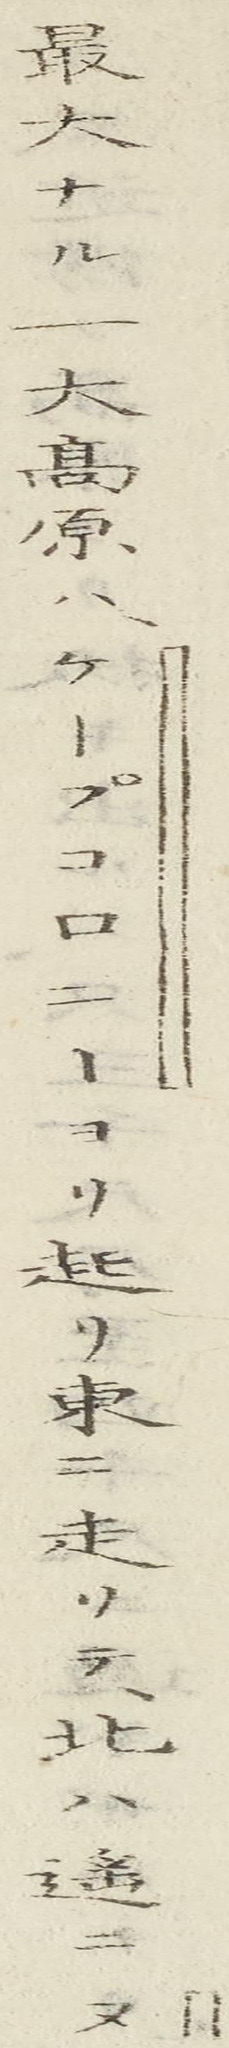最大ナル一大高原ハ、ケープコロニーヨリ起リ東ニ走リテ、北ハ遥ニヌ
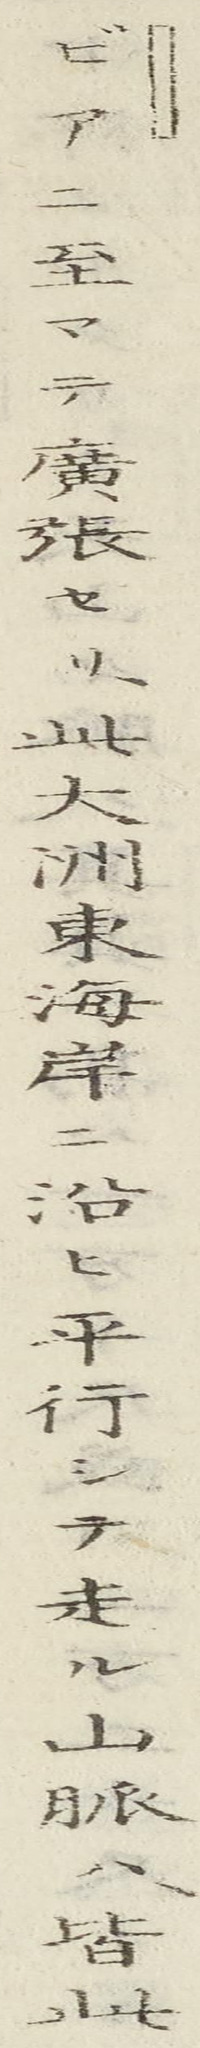ビアニ至マテ広張セリ、此大洲東海岸ニ沿ヒ平行シテ走ル山脈ハ、皆此
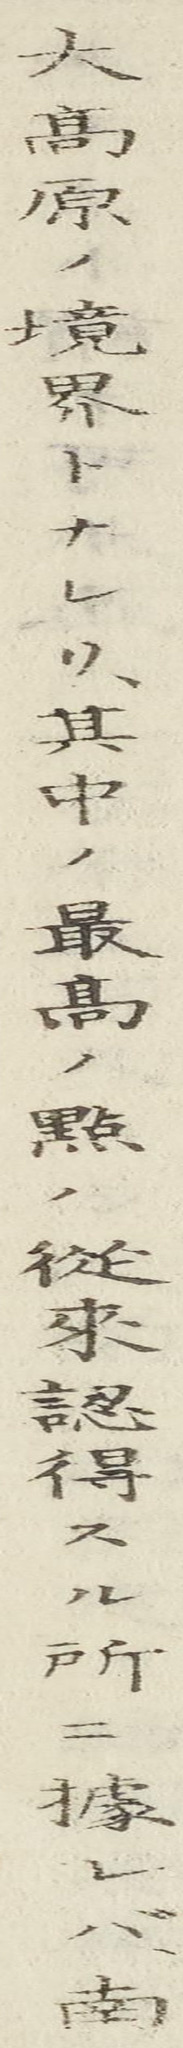大高原ノ境界トナレリ、其中ノ最高ノ点ノ従来認得スル所ニ拠レバ、南
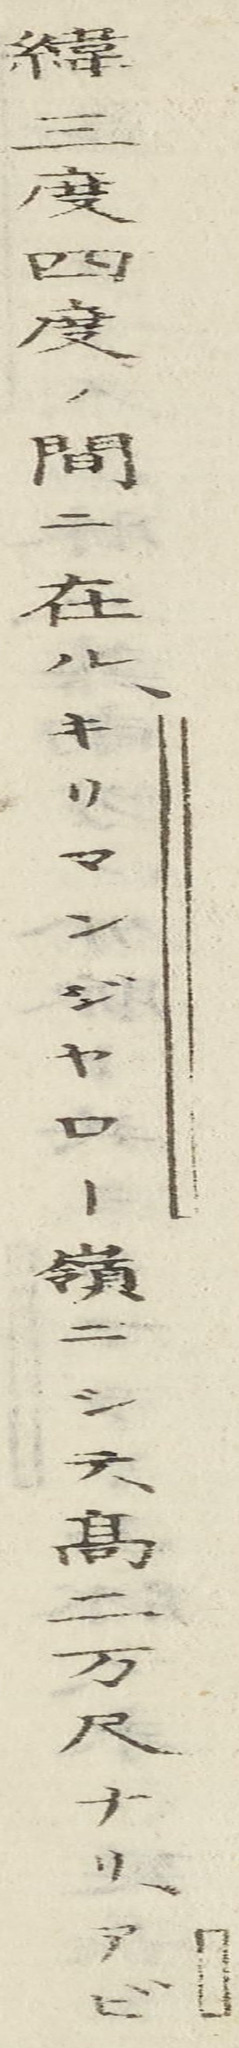緯三度四度ノ間ニ在ル、キリマンジヤロー嶺ニシテ高二万尺ナリ、アビ
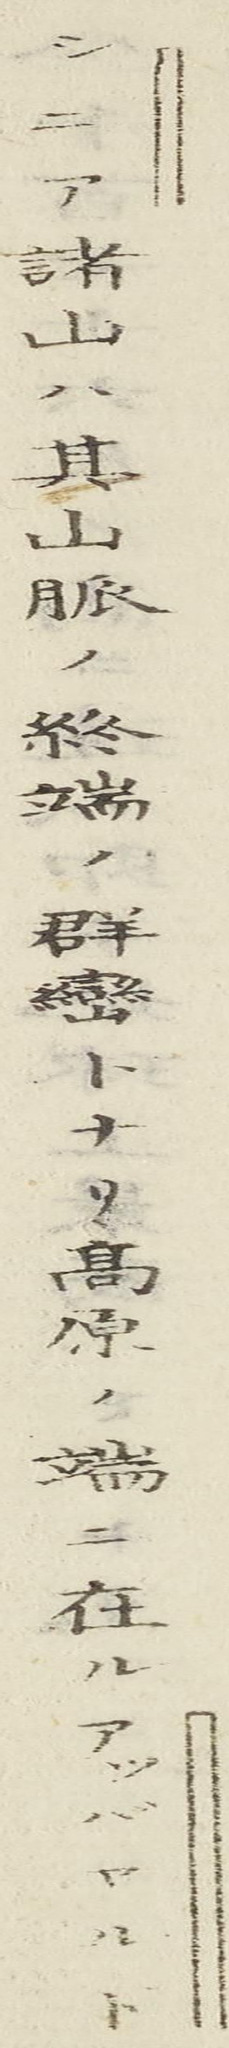シニア諸山ハ其山脈ノ終端ノ群巒トナリ高原ノ端ニ在ルアッパヤルト
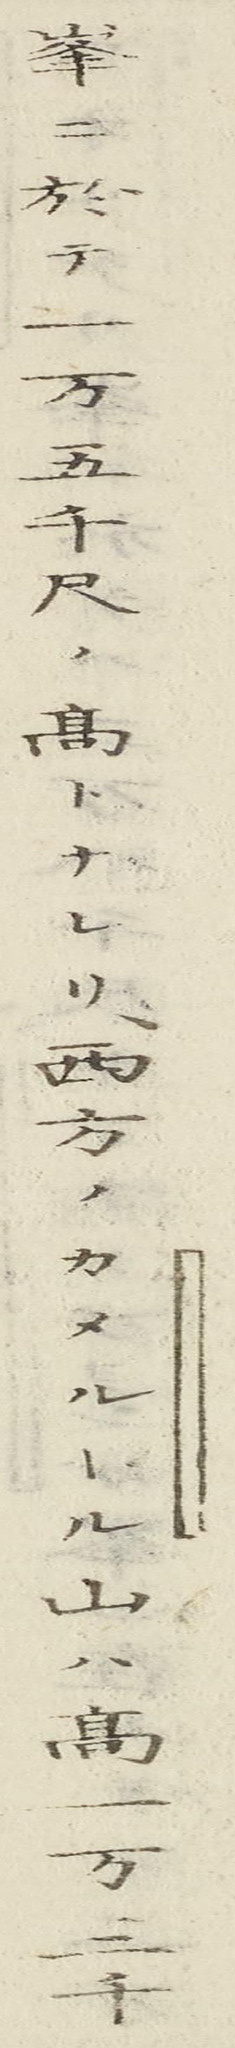峯ニ於テ一万五千尺ノ高トナレリ、西方ノカメルール山ハ高一万二千
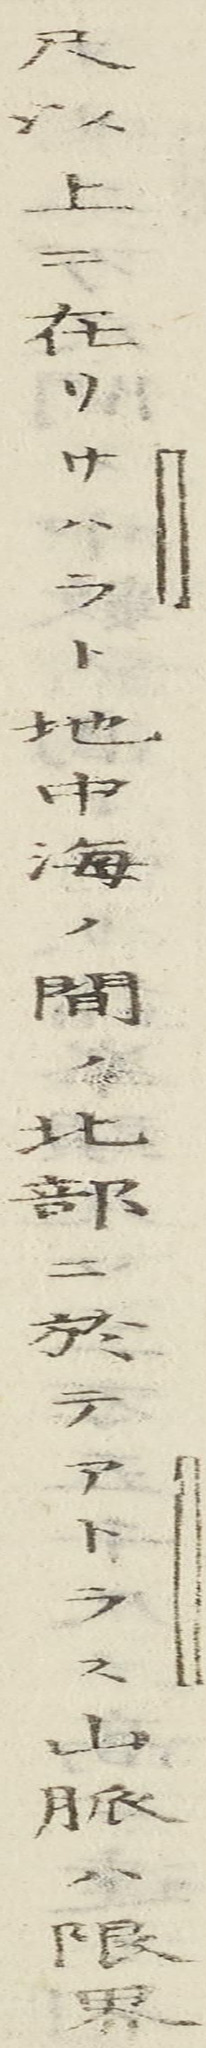尺以上ニ在リサハラト地中海ノ間ノ北部ニ於テアトラス山脈ハ限界
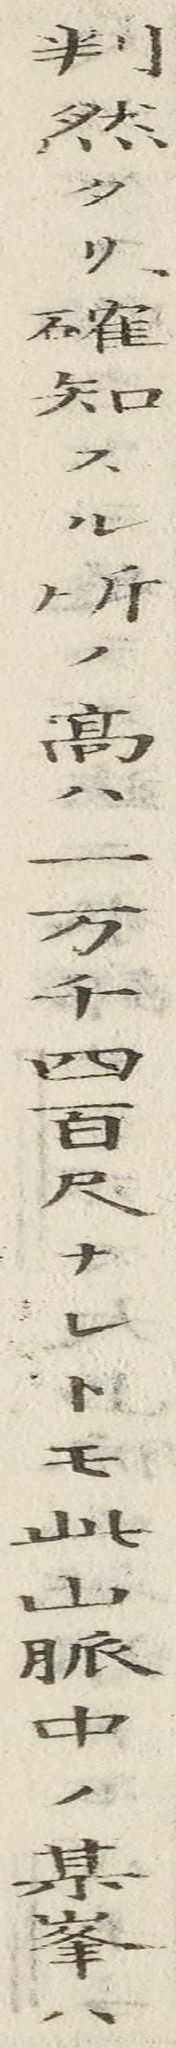判然タリ、確知スル所ノ高ハ一万千四百尺ナレトモ此山脈中ノ某峯ハ
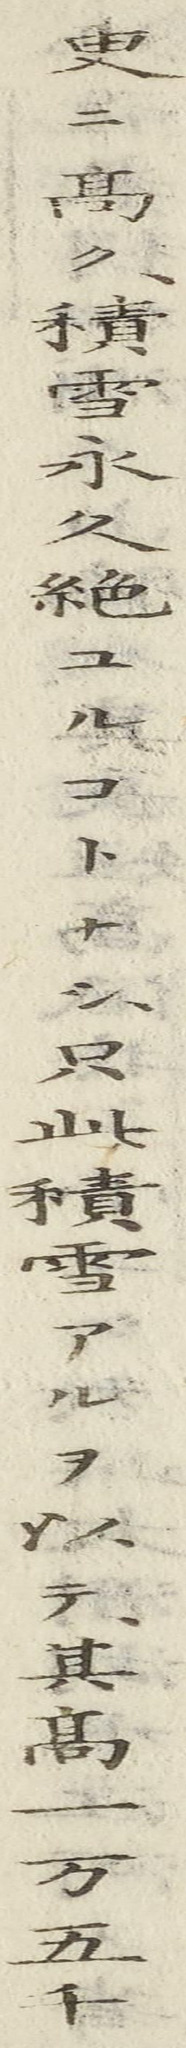更ニ高ク、積雪永久絶ユルコトナシ、只此積雪アルヲ以テ、其高一万五千
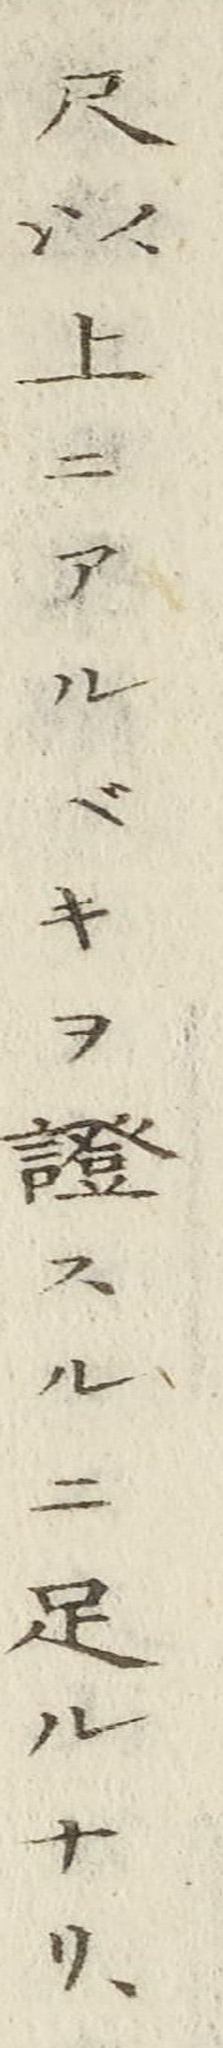尺以上ニアルベキヲ証スルニ足ルナリ、
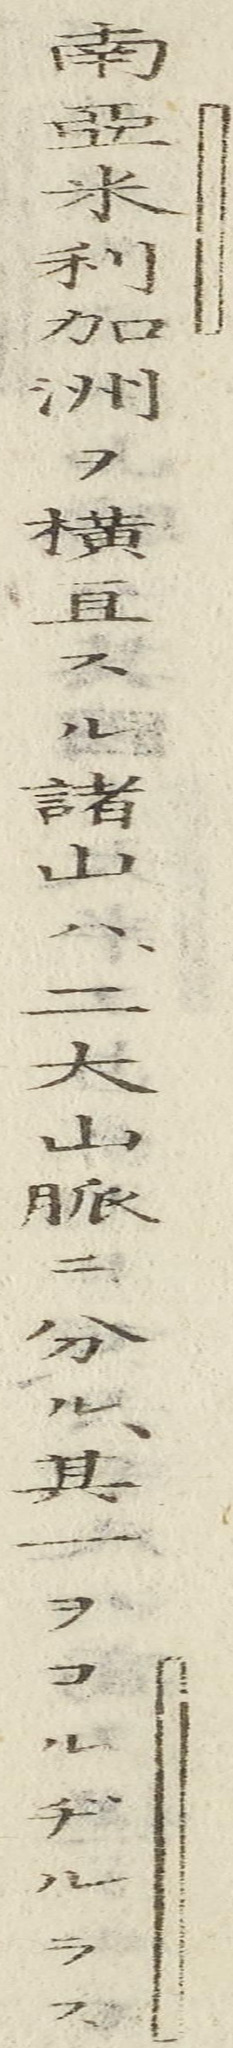南亜米利加洲ノ横亘スル諸山ハ、二大山脈ニ分ル、其一ヲコルヂルラス
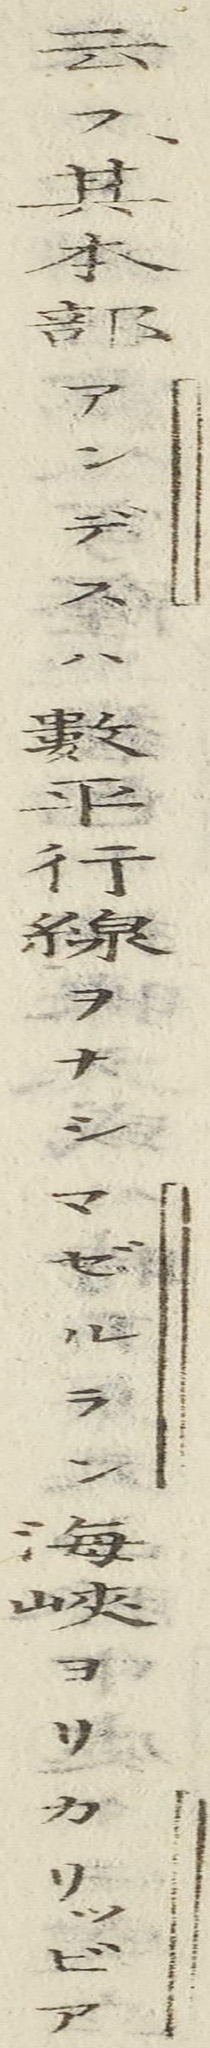云フ、其本部アンデスハ数平行線ヲナシマゼルラン海峡ヨリカリッビア
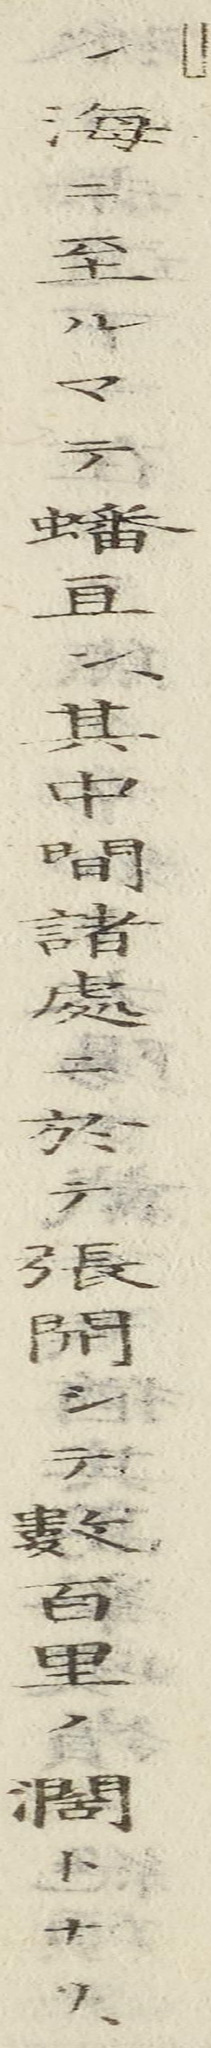ン海ニ至ルマテ蟠亘シ、其中間諸処ニ於テ張開シテ数百里ノ濶トナリ、
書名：百科全書　地文學　全
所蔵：東京大学地震研究所図書室 Earthquake Research Institute Library, The University of Tokyo, JAPAN
